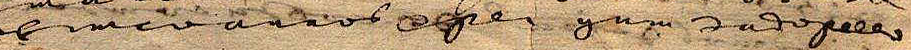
e simco annos e pergumtado pello
